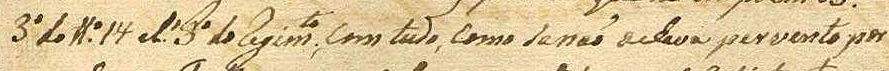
3o do tt.o 14 e L.o 3.o do Regim.to, com tudo, como se naõ achava pervento por
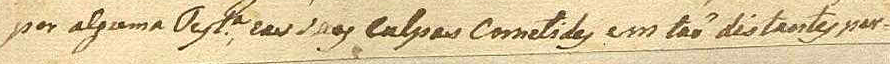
por alguma Test.a, e as suas culpas cometidas em taõ distantes par
